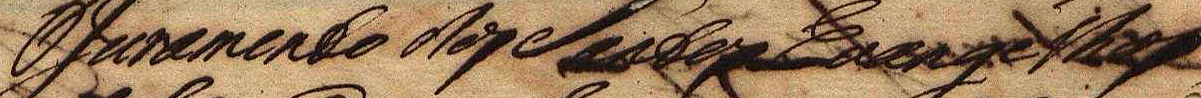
O Juramento dos Santos Evangélhos
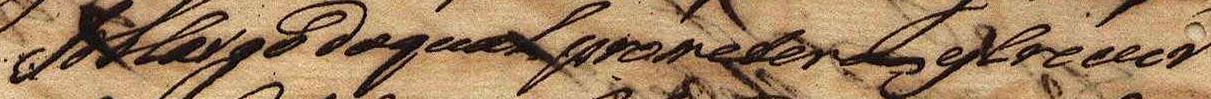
SobCargo do qual prometera escrever
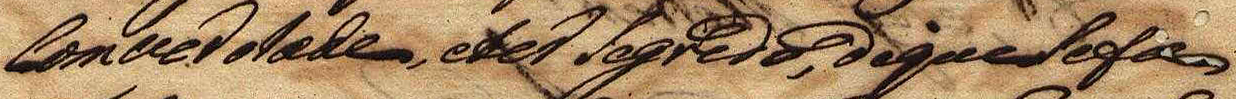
Com verdade, e ter segredo de que se fa
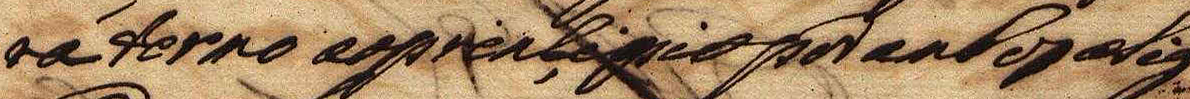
rá termo ao prinÇipio por ambos asig
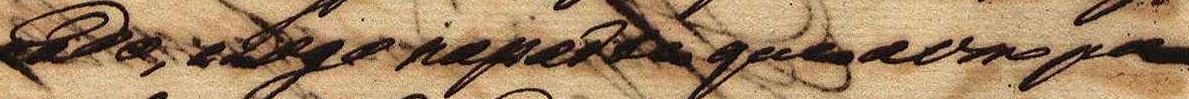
nado, e Logo na parte que a vm pa
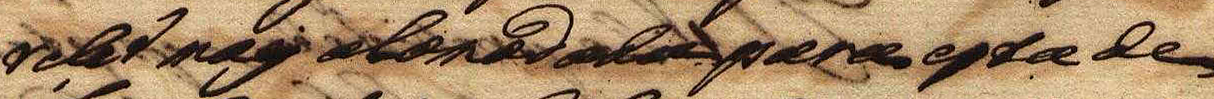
reçer mais acomodada para esta de
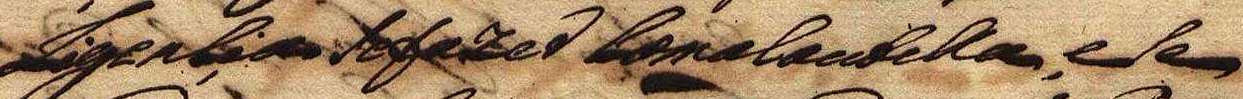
Ligençia se fazer com a Cautela, e se
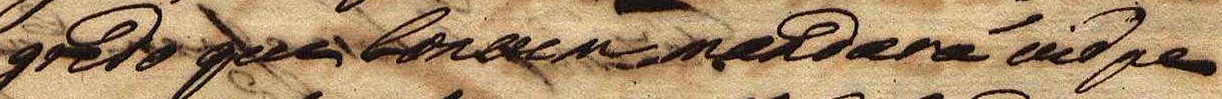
gredo que Convem mandará vir pe
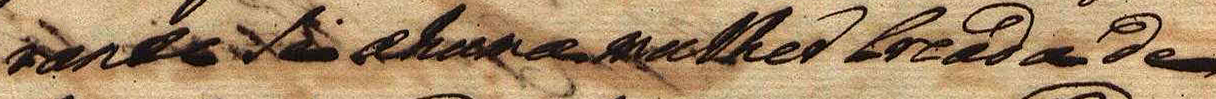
rante si a huma mulher Creada de
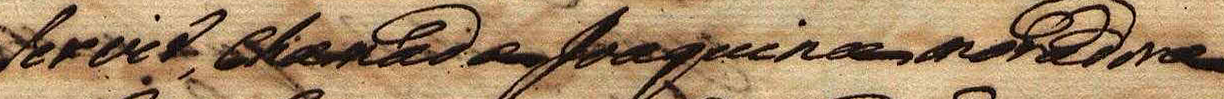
servir, chamada Joaquina moradora
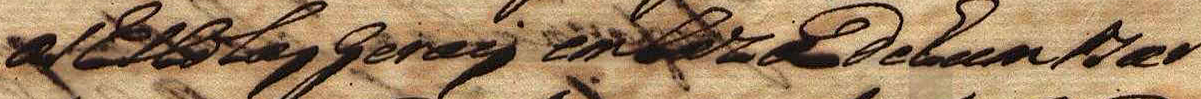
as EsColas Gerais em Caza de hum Bar
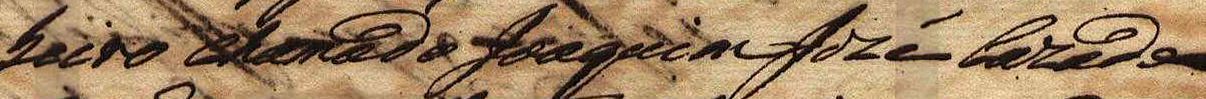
beiro chamado Joaquim Jozé Cazado
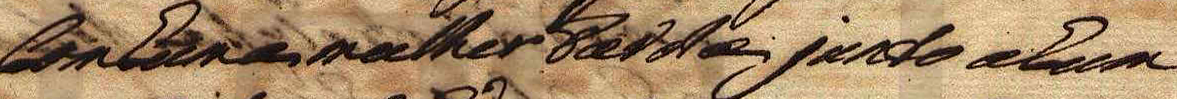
com huma mulher Parda junto a hum
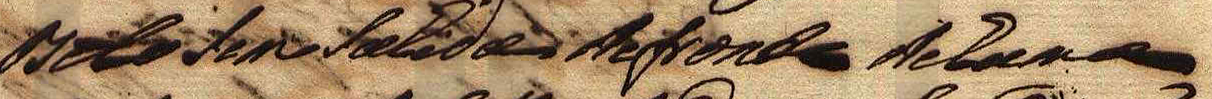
BeCo sem sahida defronte de huma
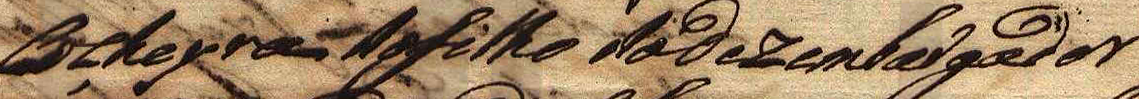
Coçheyra do filho do Dezembargador
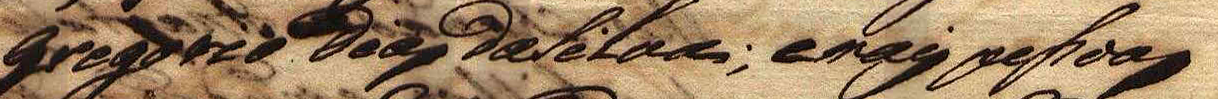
gregorio Dios da siLva; e mais pessoas
